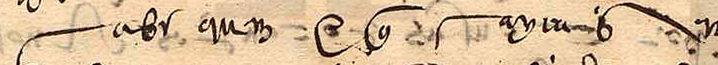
sabe quem e q̄ sayra sem
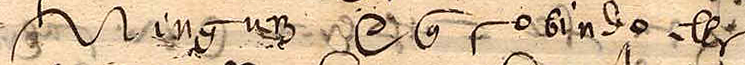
Ninguem e q̄ sobindo elle
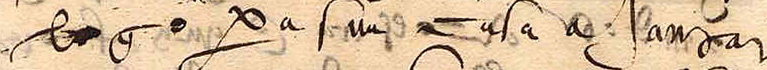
logo ꝑ a sua casa a Jantar
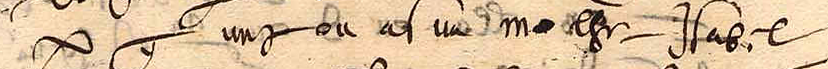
ꝑguntou a sua molher Jsabel
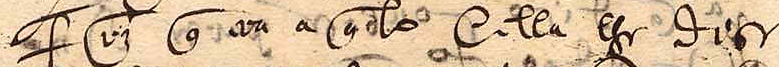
fr̄z q̄ era aq̄lo e ella lhe dise
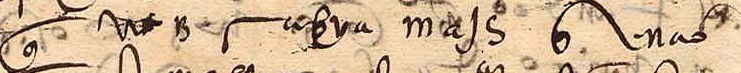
q̄ nom sabya maJs senão
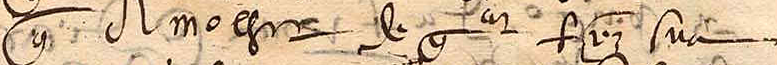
q̄ A molher de gar fr̄z sua
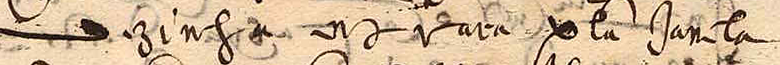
vezinha entrara plā Janela
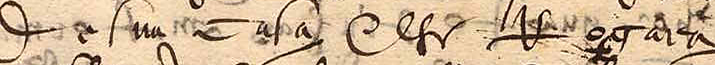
de sua casa e lhe Rogara
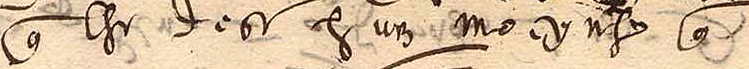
q̄ lhe dese hum mocynho q̄
